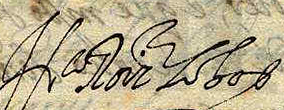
frco Roiz̄ lobo
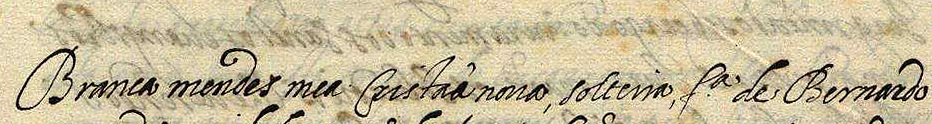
Branca mendes mea Cristaā noua, solteira f.a de Bernardo
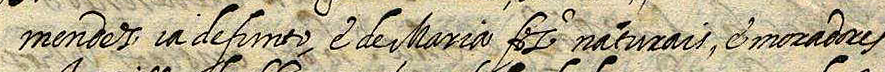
mendez ia defunto, e de Maria fez̄ naturais, e moradores
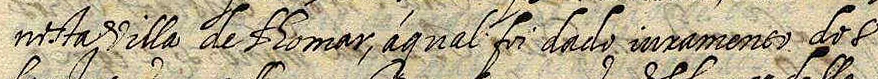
nesta villa de thomar, a qual foi dado iuramento dos
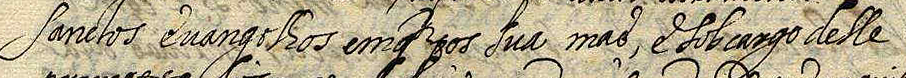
Sanctos euangelhos em q̄ pos sua maõ, e sob cargo delle
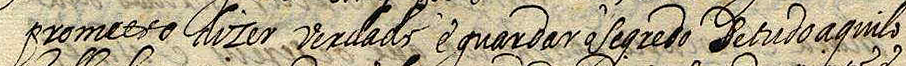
prometeo dizer verdade e guardar o segredo de tudo aquilo
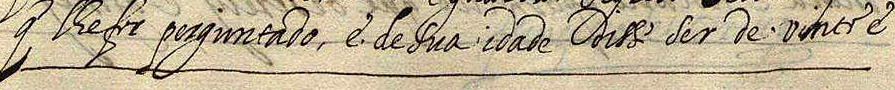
q̄ lhe foi perguntado, e de sua idade disse ser de vinte e
